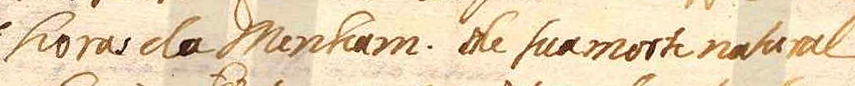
horas da menham. de sua morte natural
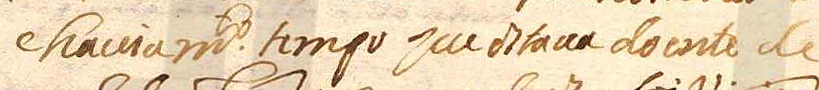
e hauia mto. tempo que estaua doente de
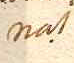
na.l
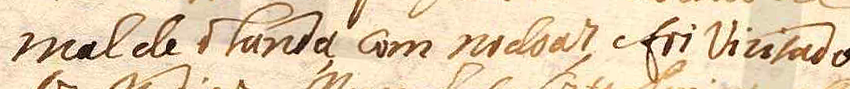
mal de Olanda, com nodoas e foi Vizitado
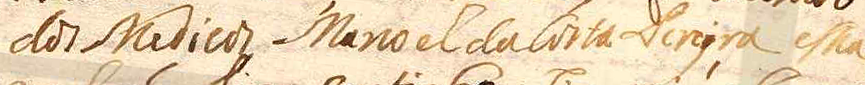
dos Medicos Manoel da Costa Pereyra e Ma
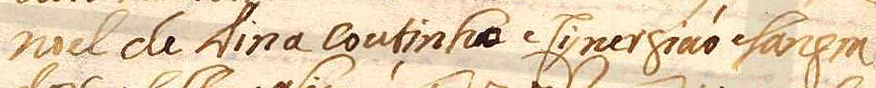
noel de Pina coutinho e Cyrurgiaõ e sangra
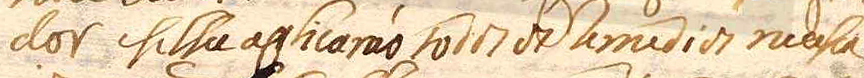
dor e se lhe aplicaraõ todos os Remedios necessa
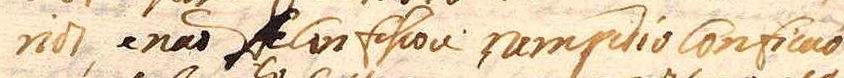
rios, e naõ se confessou nem pedio confiçaõ
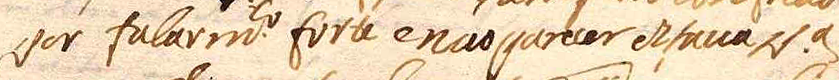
por falar m.to forte e não parecer estaua p.a
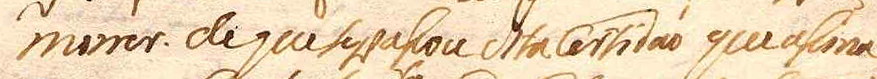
morrer de que se passou esta certidaõ que assina
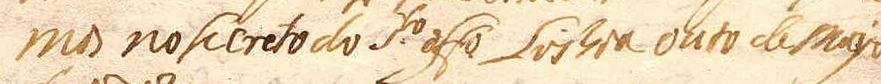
mos no secreto do s.to offo Lisboa outo de Mayo
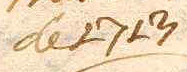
de 1713.
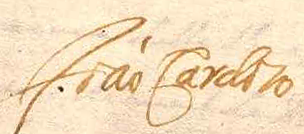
Joaõ Cardozo
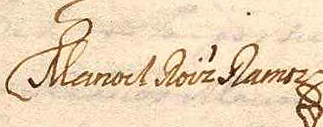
Manoel Roiz̄ Ramos
